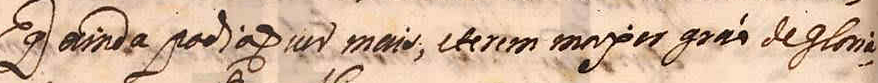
q̄ ainda podiaõ uer mais, e terem mayor graó de gloria
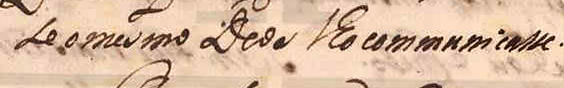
se o mesmo Deos lho communicasse.
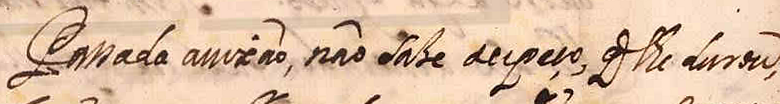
Passada a uizaõ, não sabe o espaço, q̄ lhe durou,
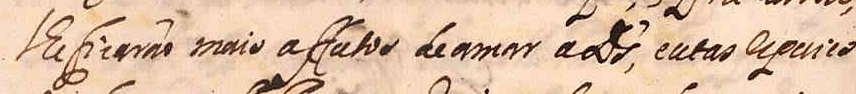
lhe ficarão mais affectos de amar a Ds̄, e estas especies
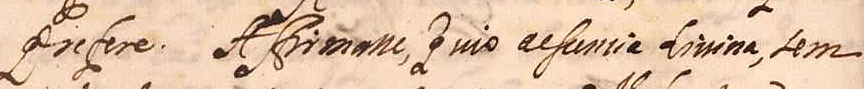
q̄ refere. Affirmasse, q̄ uio a essencia diuina, sem
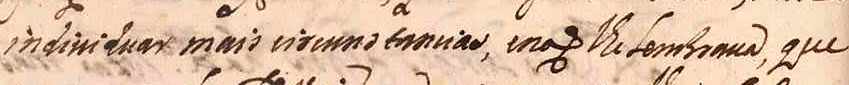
indiuiduar mais circunstancias, e naõ lhe lembraua, que
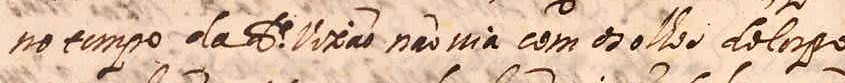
no tempo da d̄.a Vizaõ naõ uia com os olhos do corpo
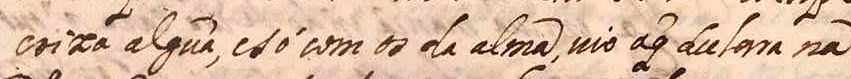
coiza algua, e só com os da alma, uio a q̄ declara na
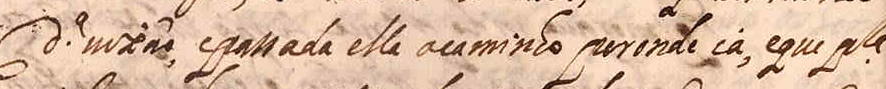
d.a uizaõ, e passada ella o caminho por onde ia, e que p.la
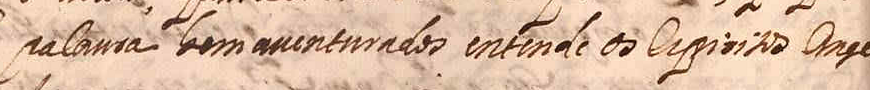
palaura bem auenturados entende os Espiritos Ange
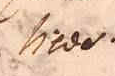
licos.
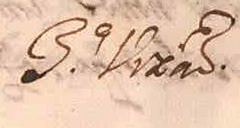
3.a Vizaõ.
